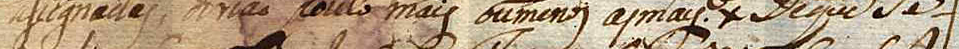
assignadas, diriaõ pouco mais ou menos as mais. x De que se
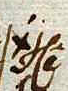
x Hê
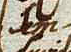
sem
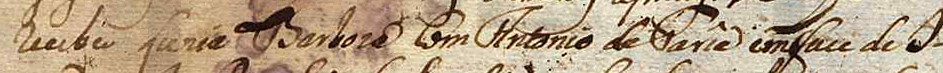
Recebeo Luzia Barboza Com Antonio de Faria em face de I
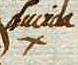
duvida
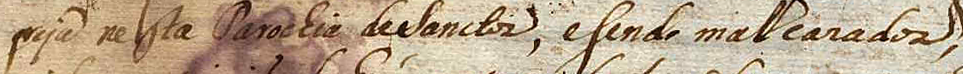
greja nesta Parochia de Sanctoz, e sendo mal cazadoz,
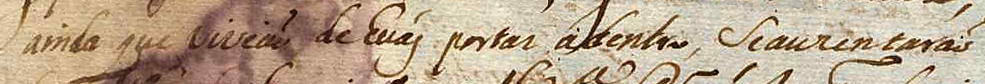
ainda que viviaõ de huās portas adentro, se auzentaraõ
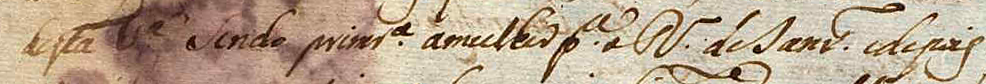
desta V.a, Sendo primr.a a mulher p.a o R.o de Ianr.o e depois
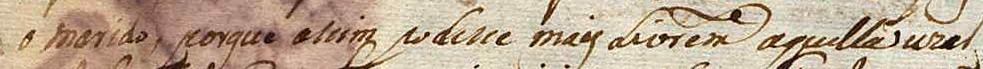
o marido, porque assim podesse mais Livremte aquella uzar
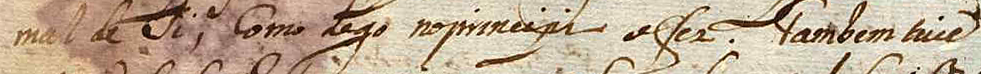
mal de Si, Como Logo no principi o fez. Tambem tiue
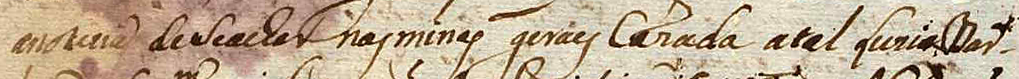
a noticia de se achar nas minas geraes Cazada a tal Luzia Bar.
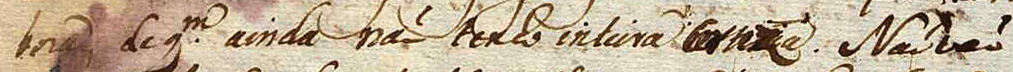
boza, de q.m ainda naõ tenho inteira certeza. Naõ vaõ
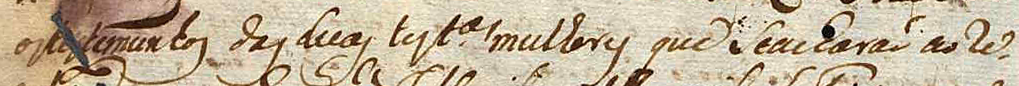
os testemunhos das duas test.as mulheres que se acharaõ ao Re
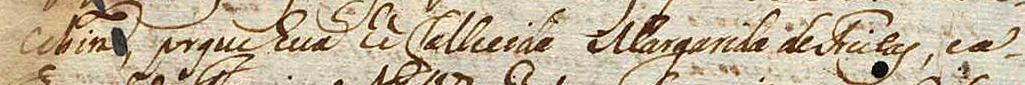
cebimto, porque huā hè fallecida Margarida de Freitas, e a
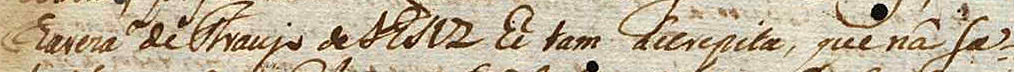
Thareza de Araujo de IESVs hè tam decrepita, que naõ sa
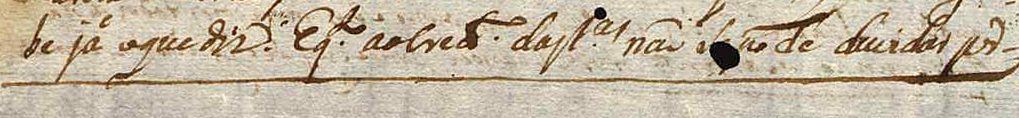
be já o que diz: E q.to ao cred̄.o das t.as naõ s pode duvidar por
